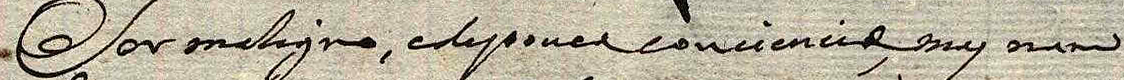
Ser maligno, e de pouca conciencia, mas nam
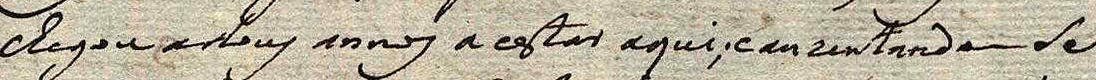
chegou a dous annos a estar aqui; e auzentando-se
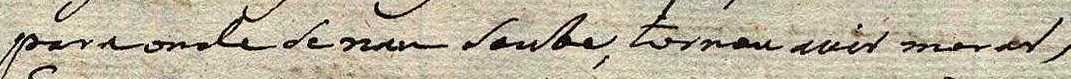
para onde se nan soube, tornou a uir morar,
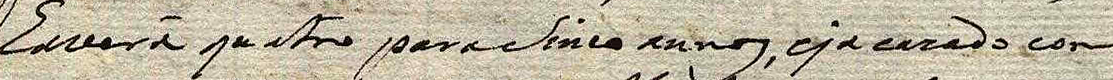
haverá quatro para sinco annos, e ja cazado con
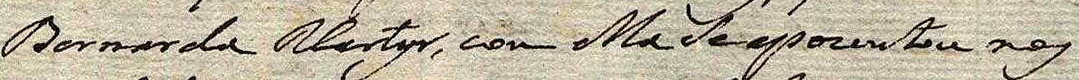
Bernarda Martyr, con ella se apozentou nos
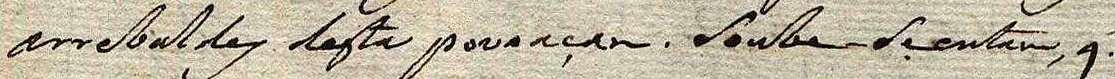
arrebaldes desta povoaçan. Soube-se entam, q̄
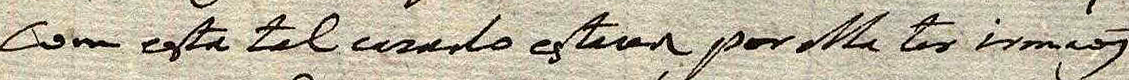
com esta tal cazado estava por elle ter irmaõs
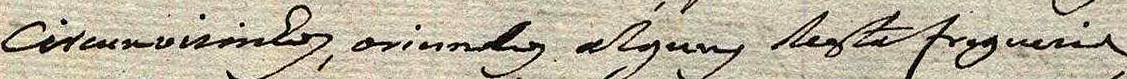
circunvizinhos, oriundos alguns desta freguezia,
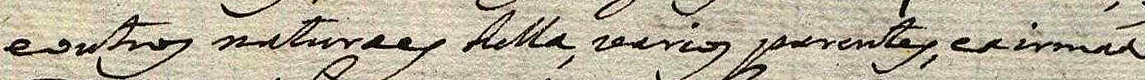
e outros naturaes della, varios parentes, e a irmaã
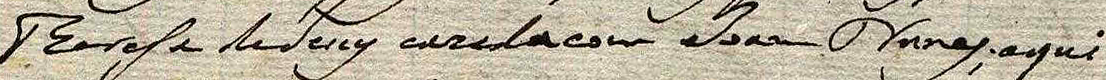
Theresa de Iesus cazada com Ioam Nunes, aqui
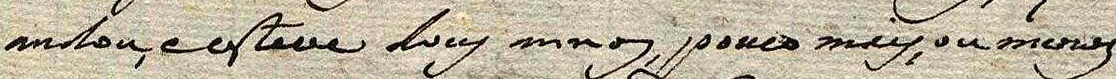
andou, e esteve dous annos, pouco mais, ou menos
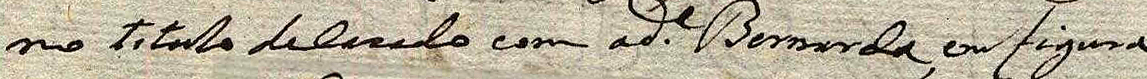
no titulo de cazado com a d.a Bernarda, em figura
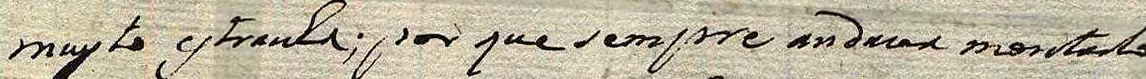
muyto estranha; por que sempre andava montado
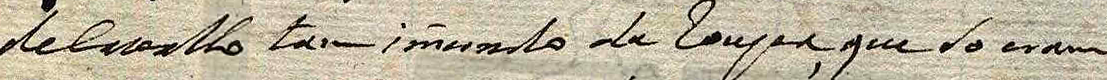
de Cavallo tam im̄undo da Roupa, que so eram
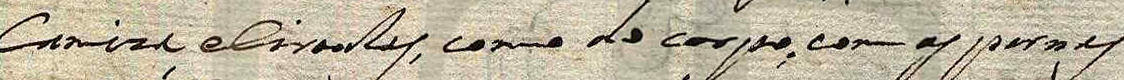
Camiza, e Ciroulas, como do corpo; com as pernas
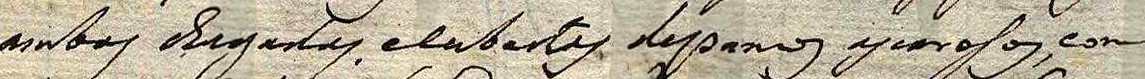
ambas chegadas, e cubertas de panos ascarosos, com
